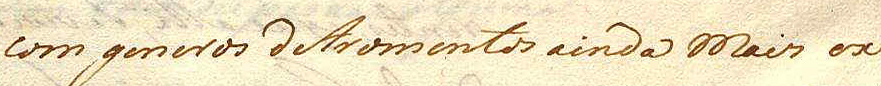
com generos de tromentos ainda mais ex
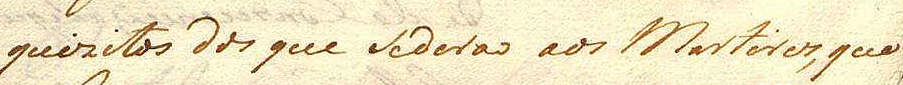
quizitos dos que se derao aos Martires, que
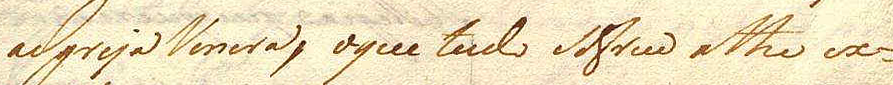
a Igreja Venera; o que tudo sofreu athe ex
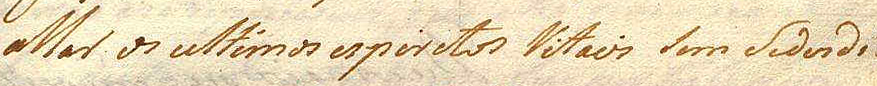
allar os ultimos espiritos Vitais sem sedesdi
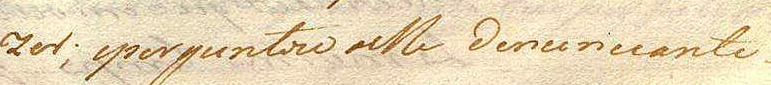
zer; e perguntou a elle denunciante
